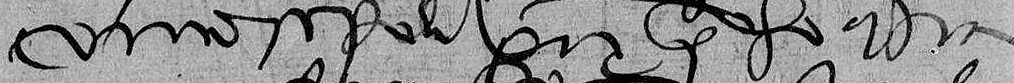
como se pode ver p̄o ho ꝯtra
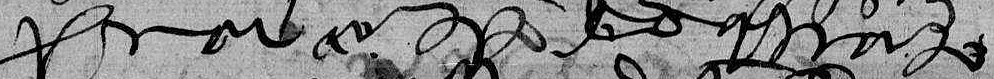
ꝓuar ao tp̄o doo ꝯtrato
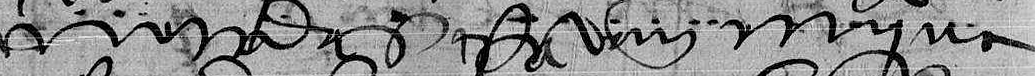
moradas estavam mujto ne
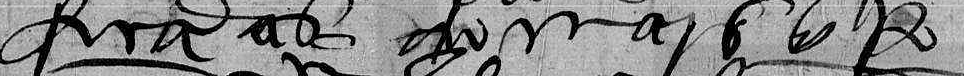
ficadas e no majs q̄ po
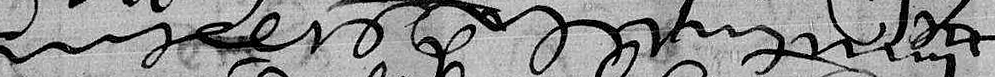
mill rs̄ p̄o terem mujta
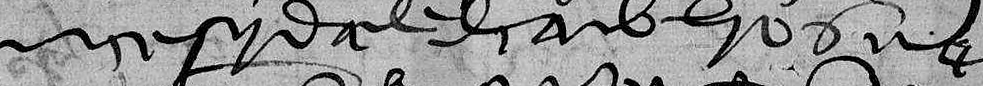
necesydade de adobjos nas
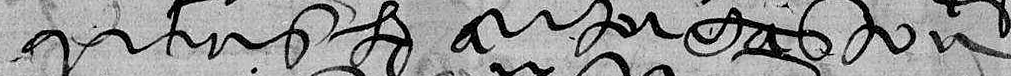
quaes ho autor gastou
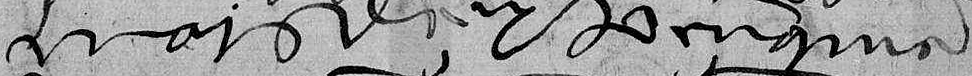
majs de cento cinquoē
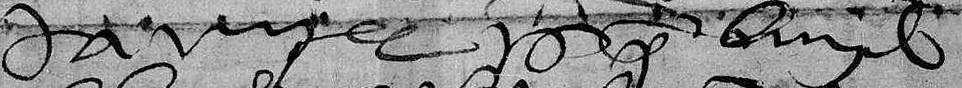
ta mjll r̄s p̄o bem do
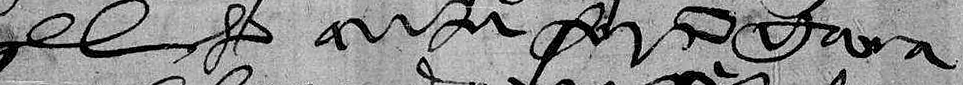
q̄ll ho autor foj ēgana
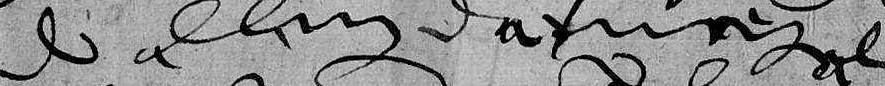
do allem da metade
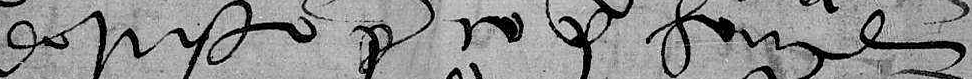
do Justo p̄ço p̄o homde
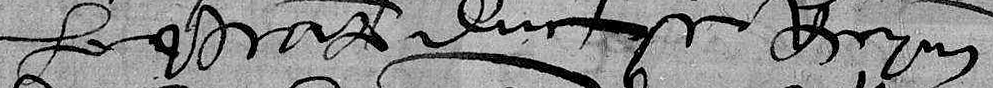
ho ꝯtrato deue ser Recym
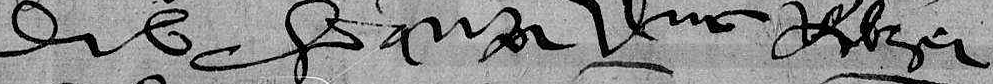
dido e ho autor deue Redozir
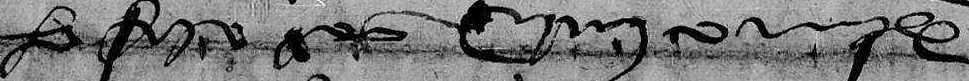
ho foro aos cjmco mjll
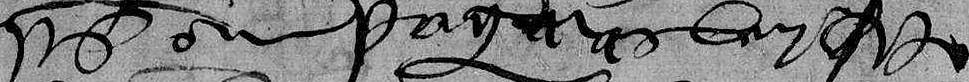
rr̄s ou pagar as bemfjto
